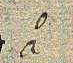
ao
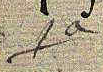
ta
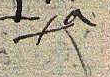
ta
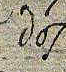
dōs
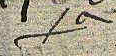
ta
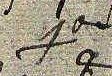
ta
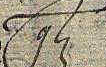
ḡlz
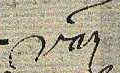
vāz
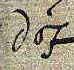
dōs
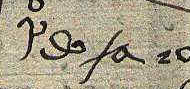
Po do faro
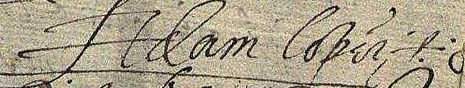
Adam lopēz
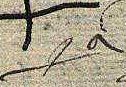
ta
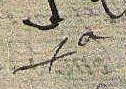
ta
